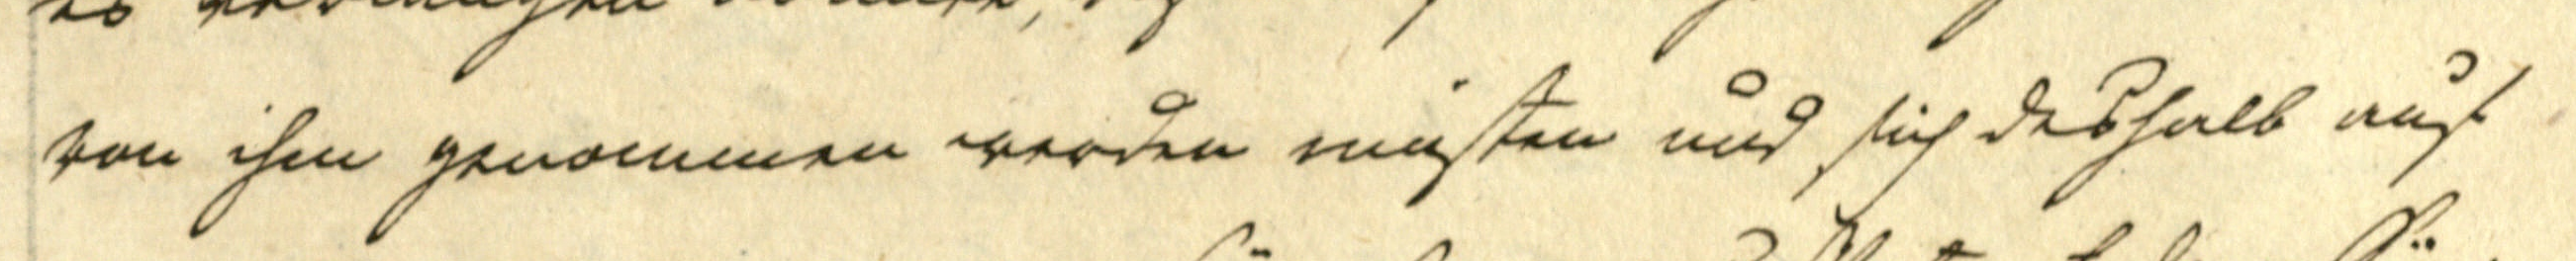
von ihm genommen werden müsten und sich deshalb auf
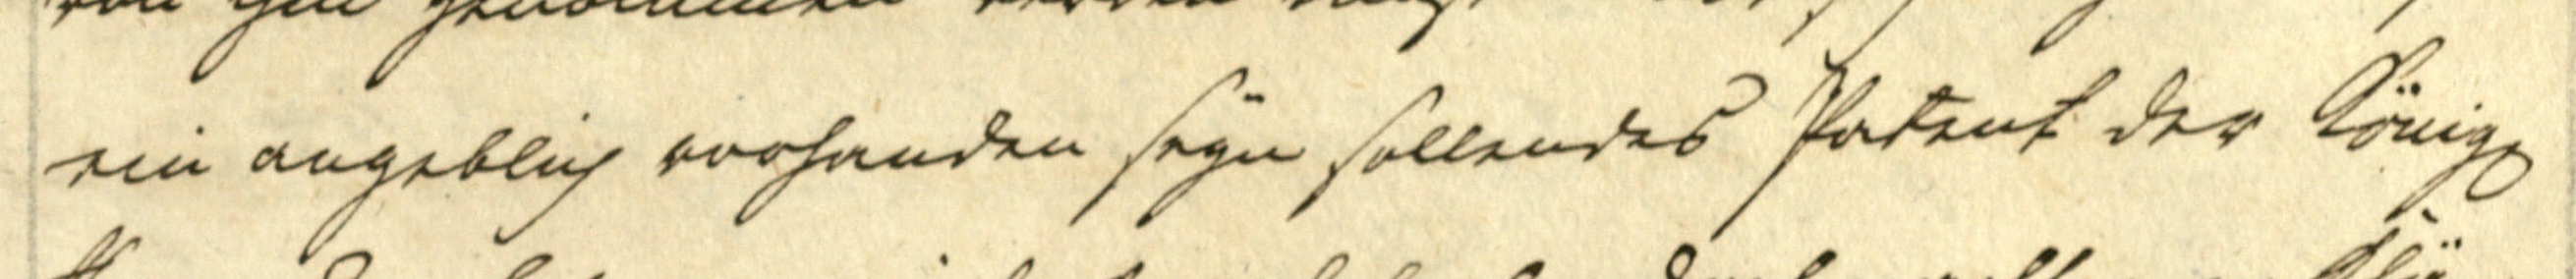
ein angeblich vorhanden seÿn sollendes Patent der Königl.
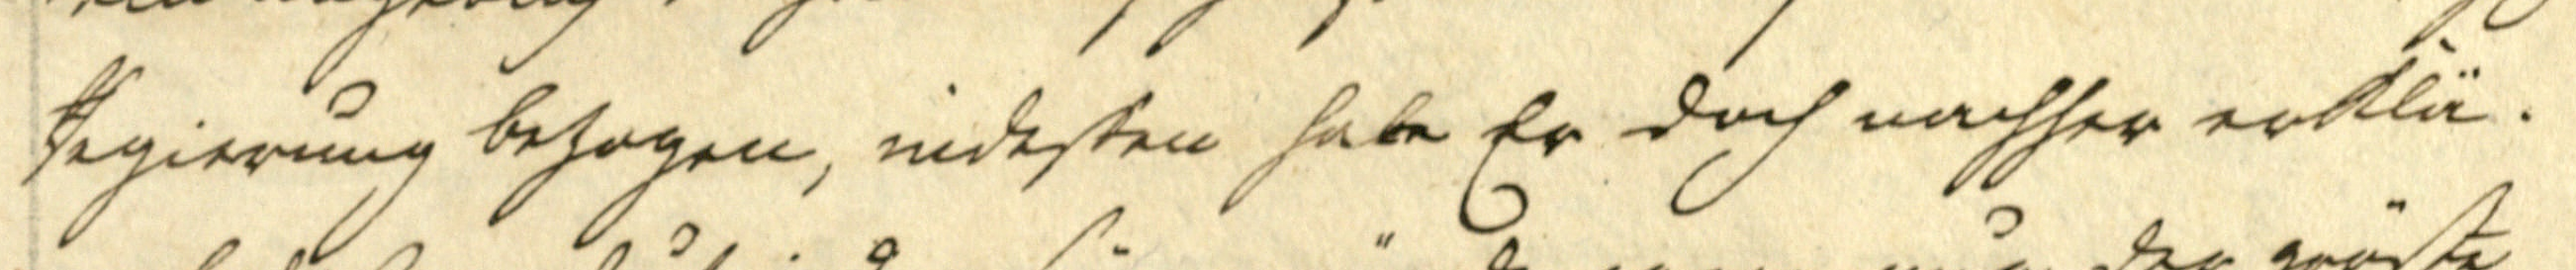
Regierung bezogen, indessen habe Er doch nachher erklä¬
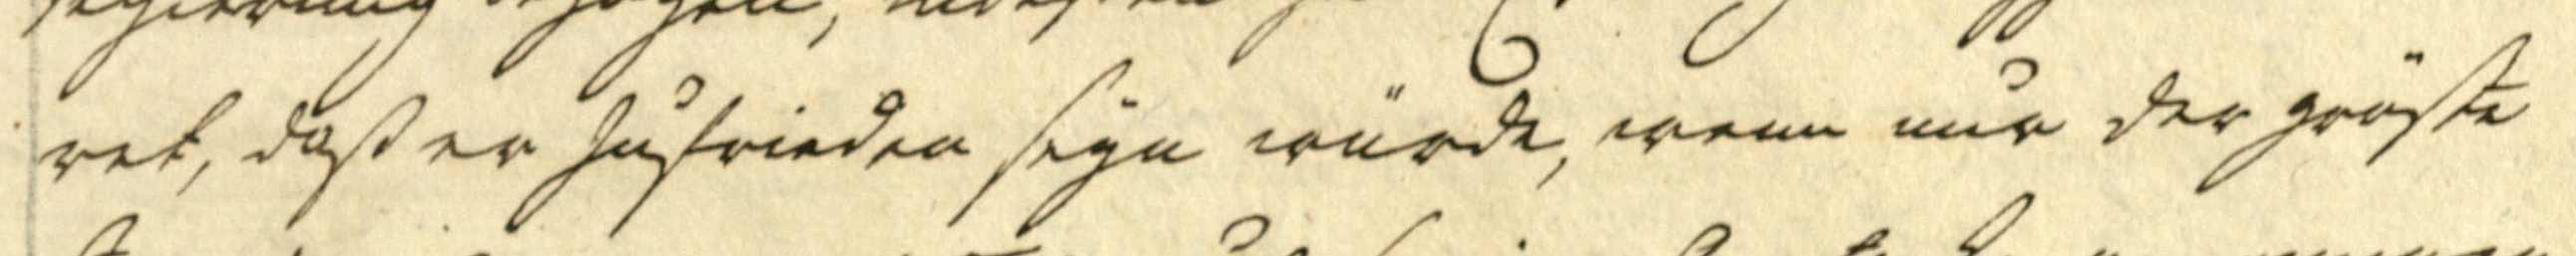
ret, daß er zufrieden seÿn würde, wenn nur der größte
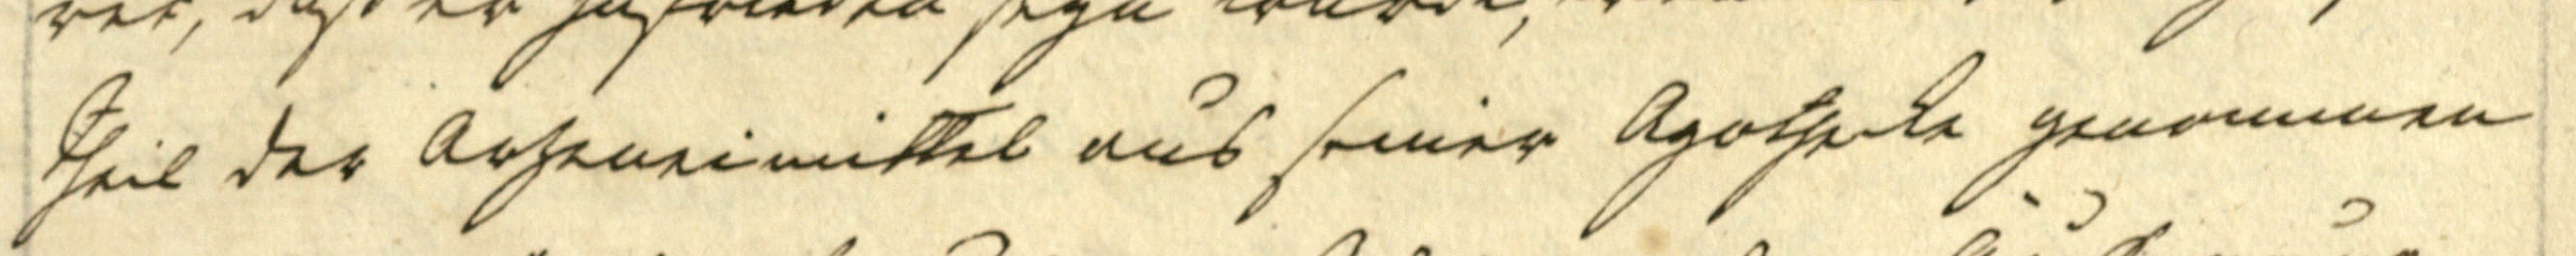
Theil der Arzeneimittel aus seiner Apothecke genommen
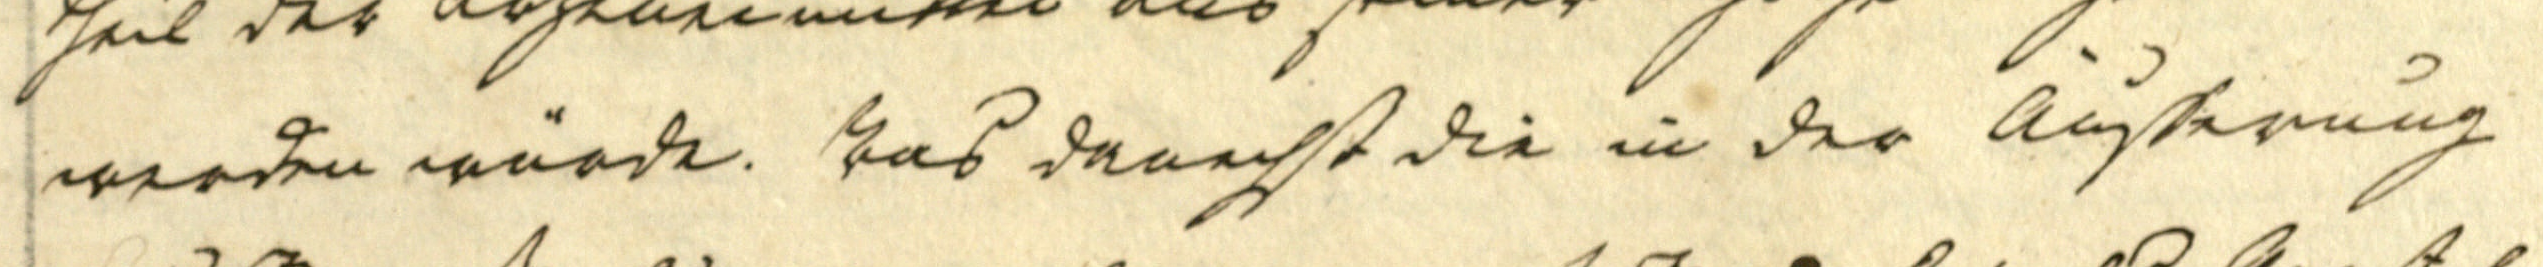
werden würde. Was danechst die in der Äusserung
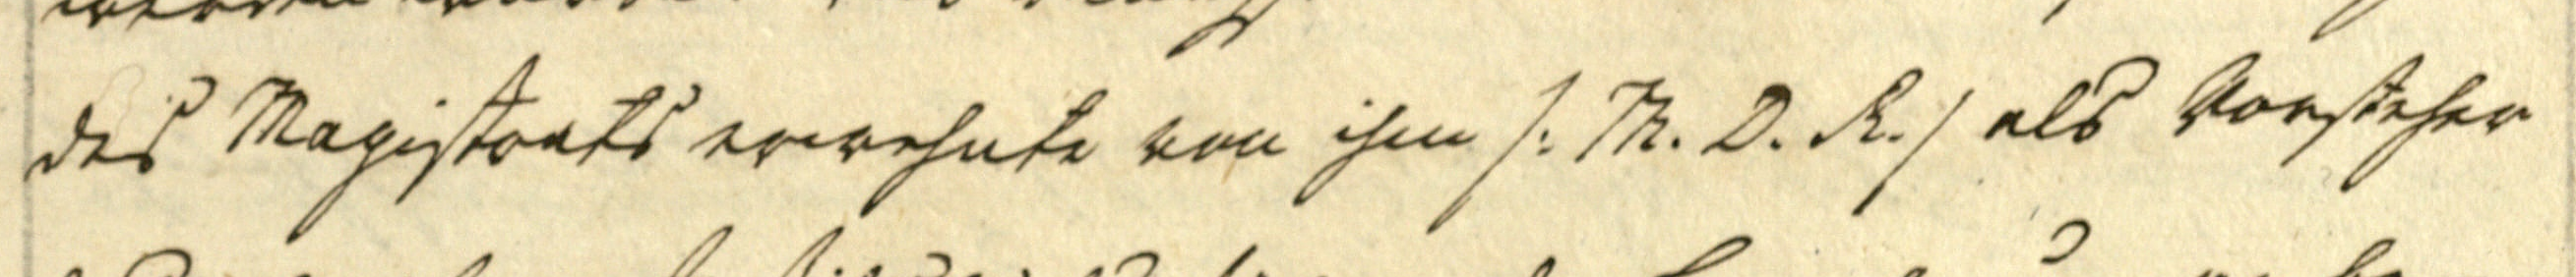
des Magistrats erwehnte von ihm /: M. D. R./ als Vorsteher
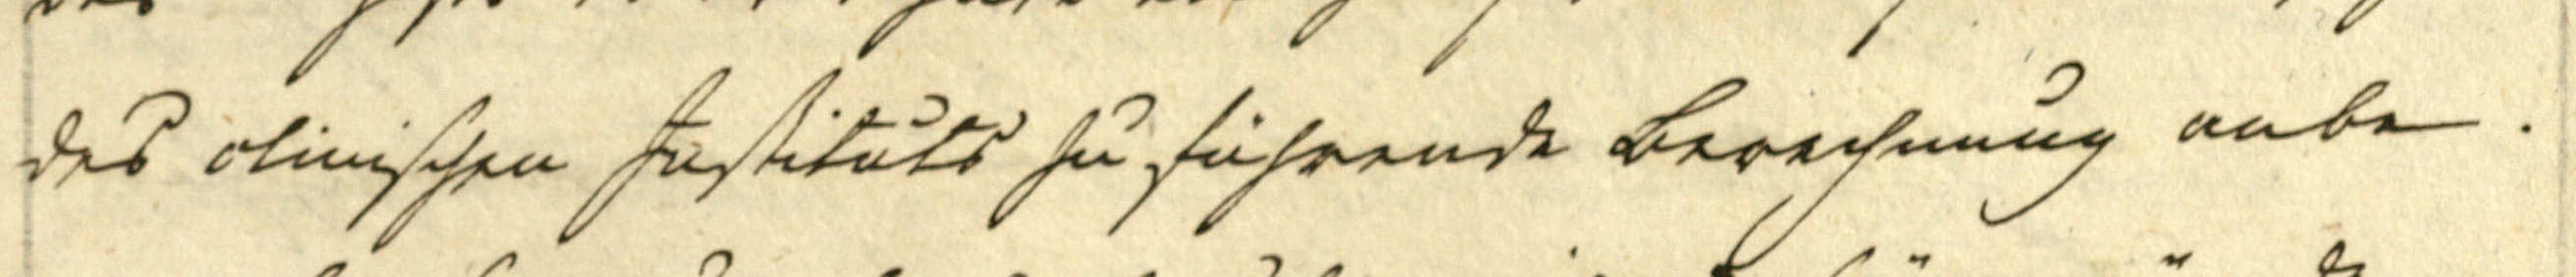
des clinischen Instituts zu führende Berechnung anbe¬
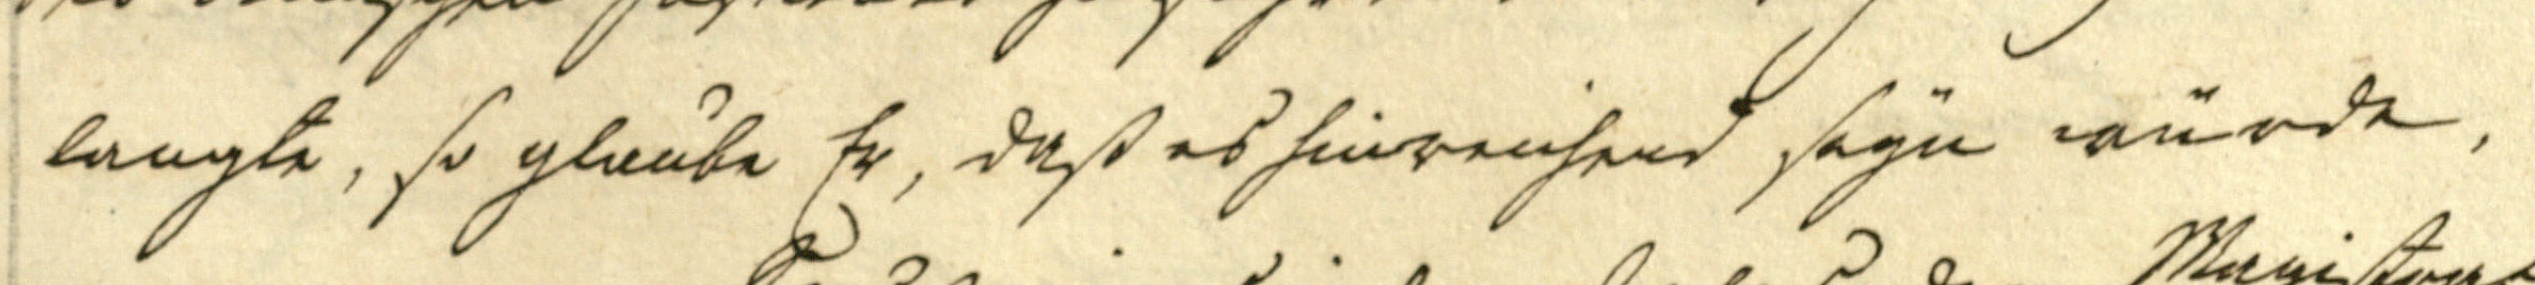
langte, so glaube Er, daß es hinreichend seÿn würde,
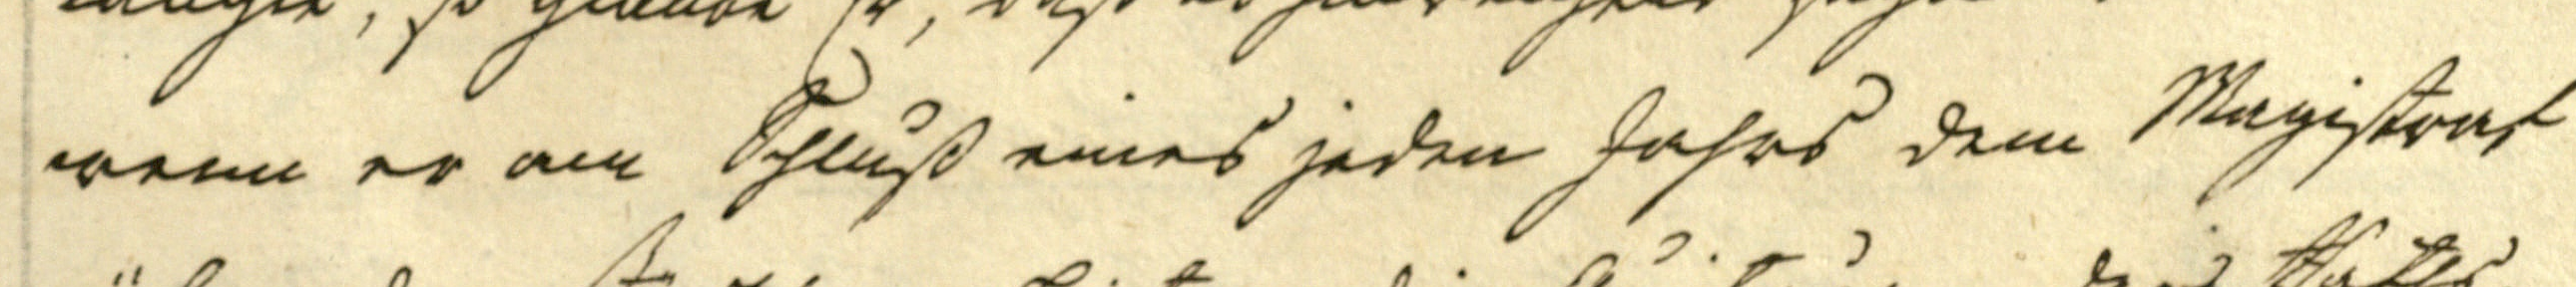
wenn er am Schluß eines jeden Jahres dem Magistrat
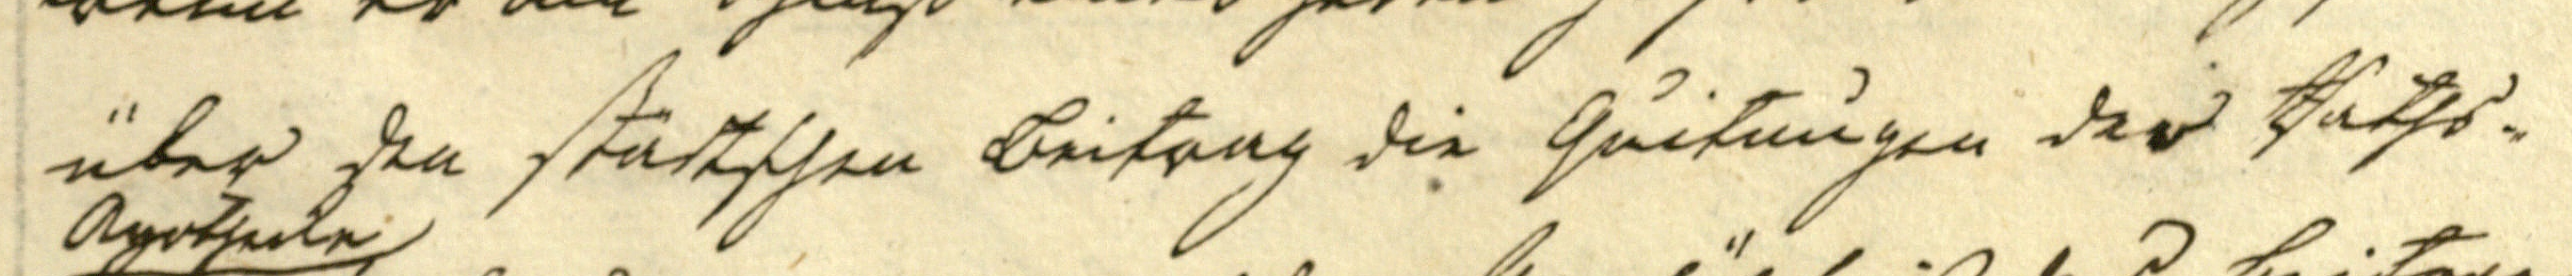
über den städtischen Beitrag die Quitungen der Raths¬
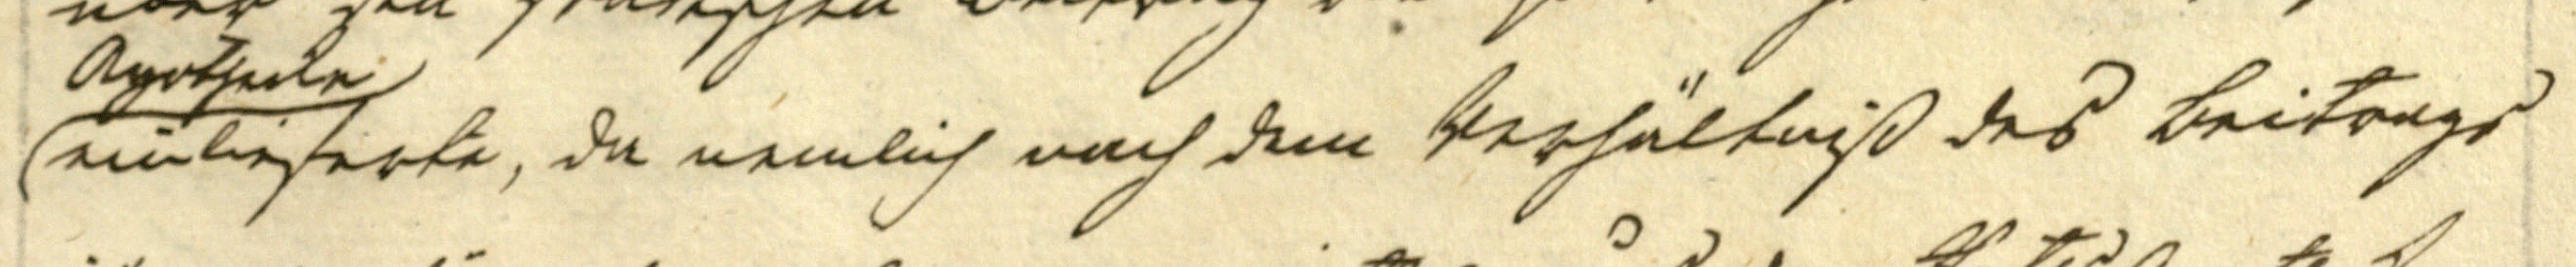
Apothecke einlieferte, da nemlich nach dem Verhältiß des Beitrags
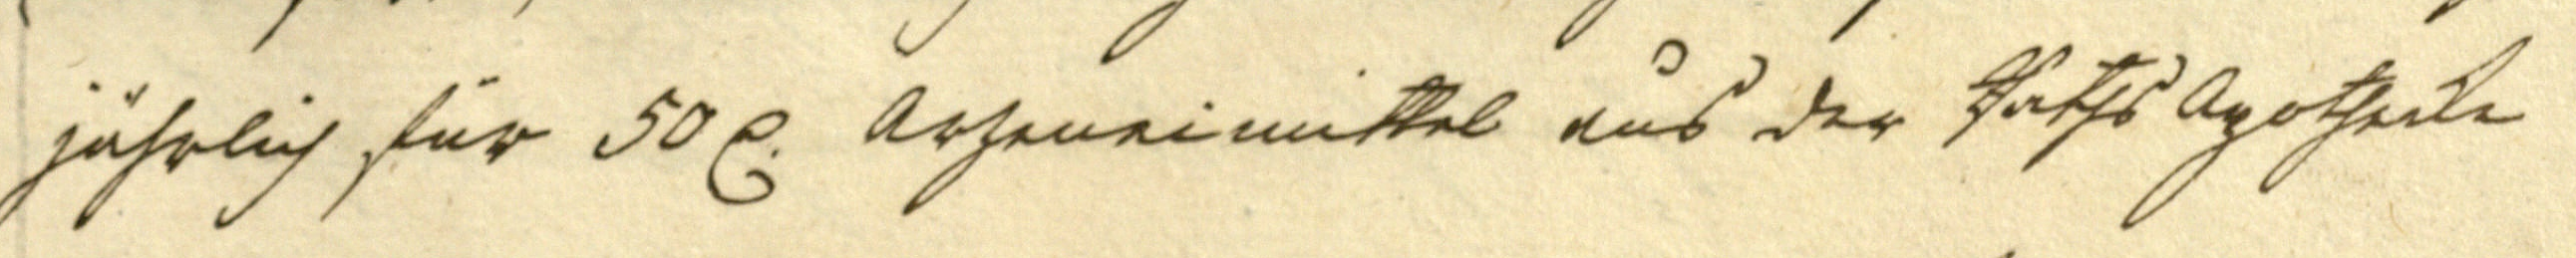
jährlich für 50 l. Arzeneimittel aus der Raths Apothecke
